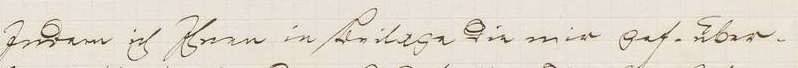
Indem ich Ihnen in Beilage die mir ges. über-
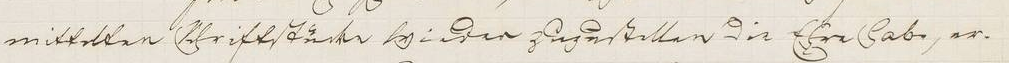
mittelten Schriftstücke wieder zuzustellen die Ehre habe, er-
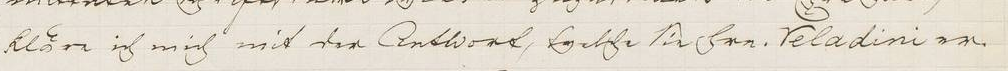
kläre ich mich mit der Antwort, welche Sie Hrn. Veladini er-
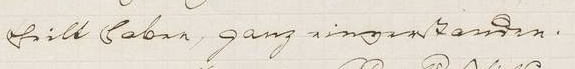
theilt haben, ganz einverstanden.
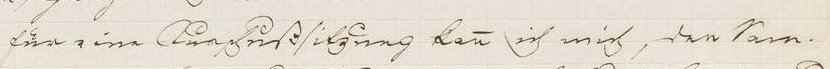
Für eine Ausschußsitzung kann ich mich, den Sam-
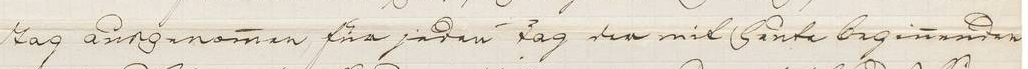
stag ausgenommen, für jeden Tag der mit heute beginnenden
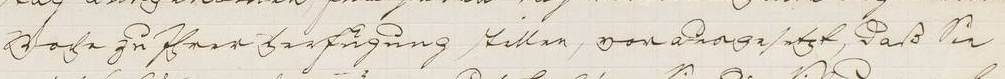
Woche zu Ihrer Verfügung stellen, vorausgesetzt, daß Sie
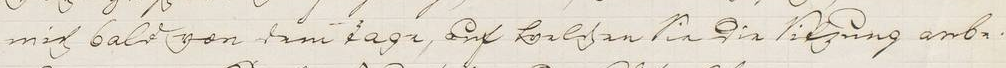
mich bald von dem Tage, auf welchen Sie die Sitzung anbe-
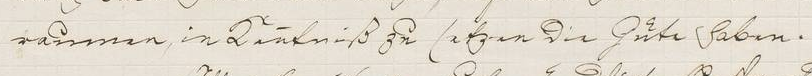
raumen, in Kenntniß zu setzten die Güte haben.
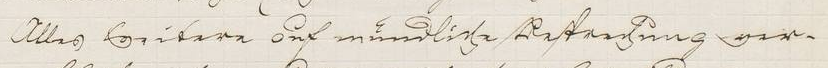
Alles weitere auf mündliche Besprechung ver-
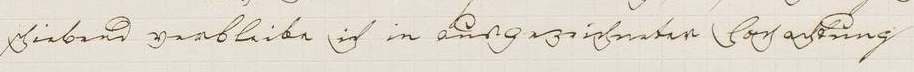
schiebend verbleibe ich in ausgezeichneter Hochachtung
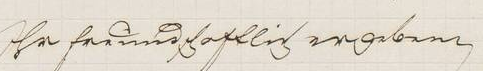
Ihr freunschaftlich ergebene
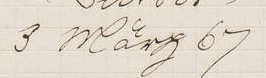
3 März
